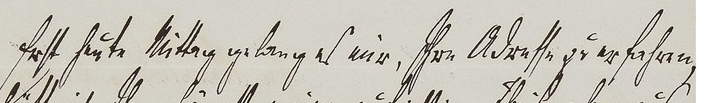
heute Mittag gelang es mir, Ihre Adresse zu
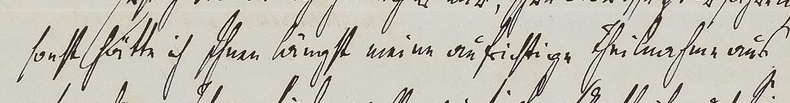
sonst hätte ich Ihnen längst meine aufrichtige Theilnahme aus-
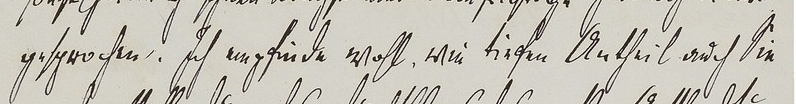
gesprochen. Ich empfinde wohl, wie tiefen Antheil auch Sie
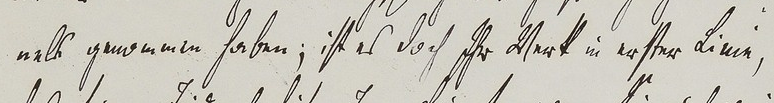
nels genommen haben; ist es doch Ihr Werk in erster Linie,
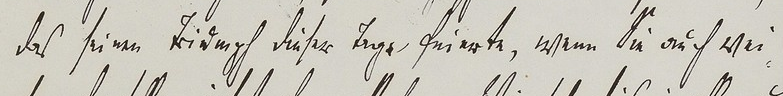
das seinen Triumph dieser Tage feierte, wenn Sie auch wei-
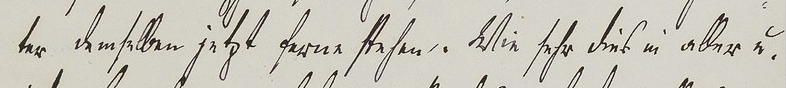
ter demselben jetzt ferne stehen. Wie sehr dies in aller u.
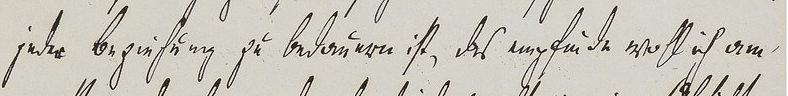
jeder Beziehung zu bedauern ist, das empfinde wohl ich am
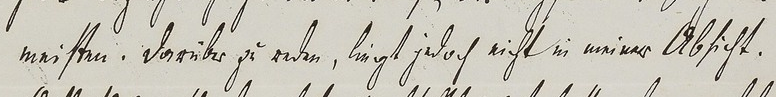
meisten. Darüber zu reden, liegt jedoch nicht in meiner Absicht.
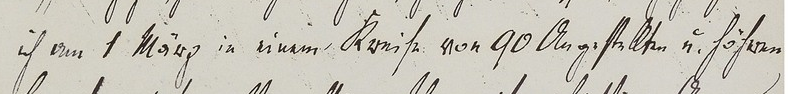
ich am 1. März in einem Kreise von 90 Angestellten u. höheren
